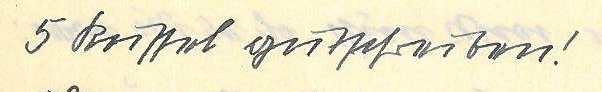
5 Kussel gutschreiben!
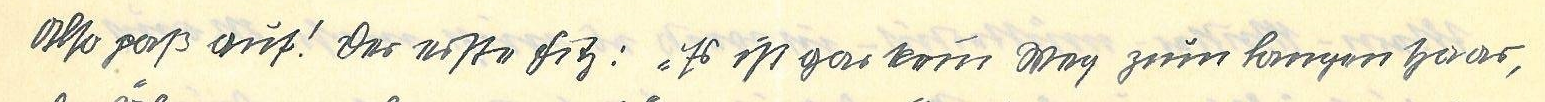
Also paß auf! Der erste Fitz: „Es ist gar kein Weg zum langen Haar,
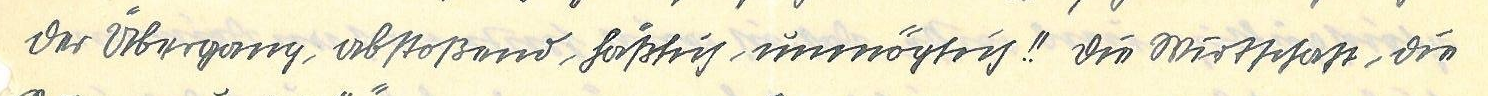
der Übergang, abstoßend, häßlich, unmöglich!! Die Wirtschaft, die
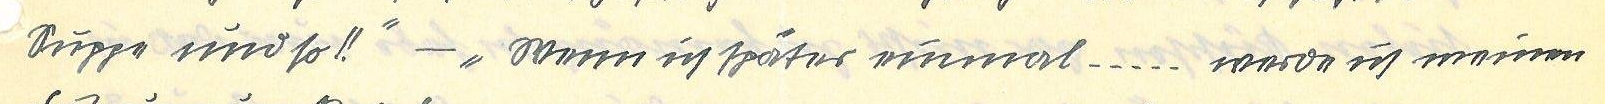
Suppe und so!!“ – „Wenn ich später einmal ….. werde ich meinen
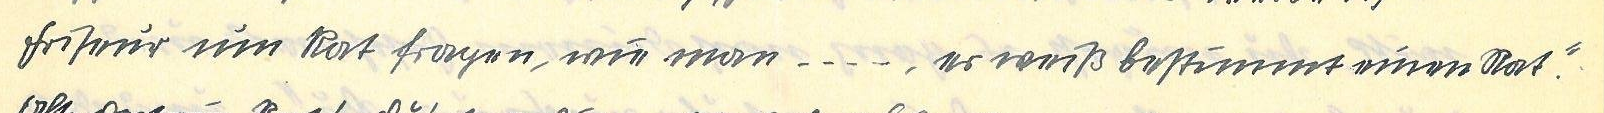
Friseur um Rat fragen, wie man …., er weiß bestimmt einen Rat“.
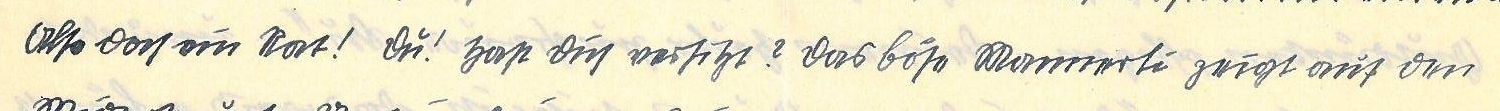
Also doch ein Rat! Du! Hast Dich verfitzt? Das böse Mannerli zeigt auf den
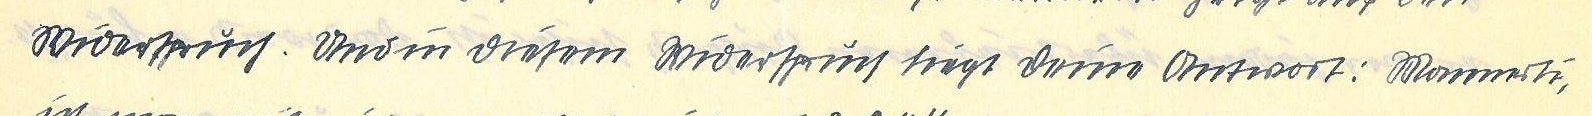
Widerspruch. Und in diesem Widerspruch liegt Deine Antwort: Mannerli,
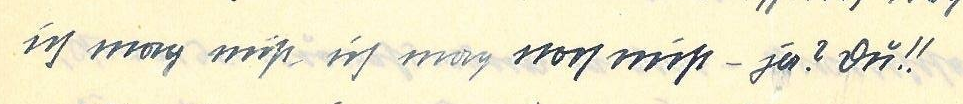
ich mag nicht, ich mag noch nicht – ja? Du!!
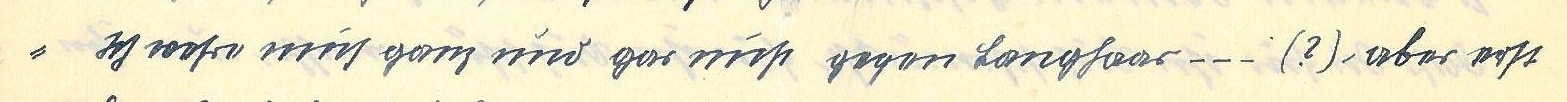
„Ich wehre mich ganz und gar nicht gegen Langhaar — (?), aber erst
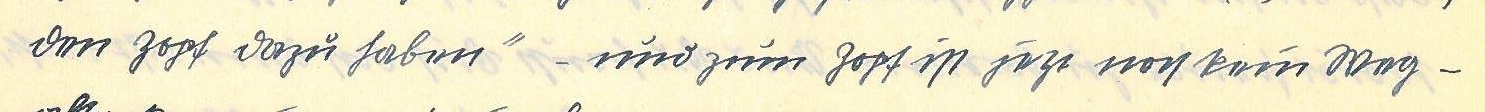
den Zopf dazu haben“ – und zum Zopf ist jetzt noch kein Weg –
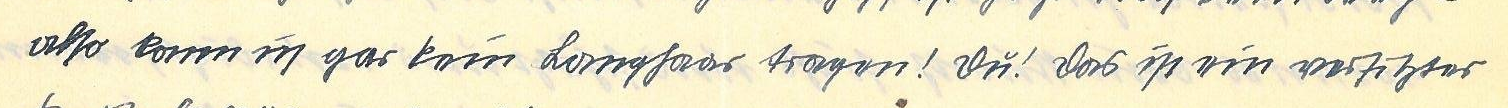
also kann ich gar kein Langhaar tragen! Du! Das ist ein verflitzter
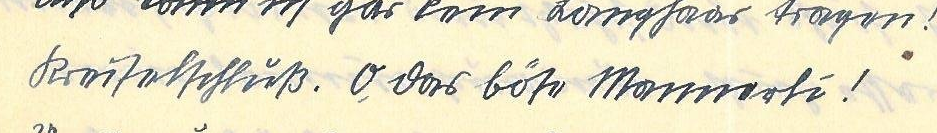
Kreiselschluß. O, das böse Mannerli!!“
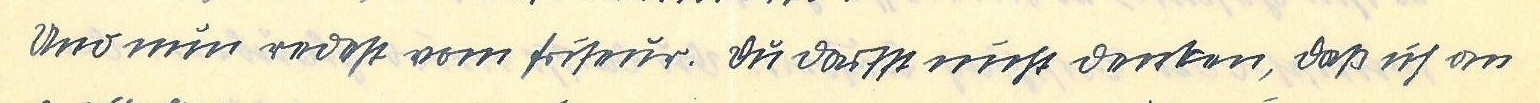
Und nun redest vom Friseur. Du darfst nicht denken, daß ich an
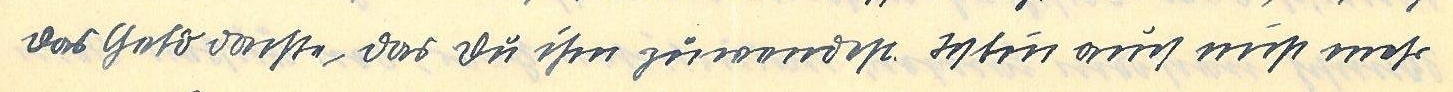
das Geld dachte, das Du ihm zuwendest. Ich bin auch nicht mehr
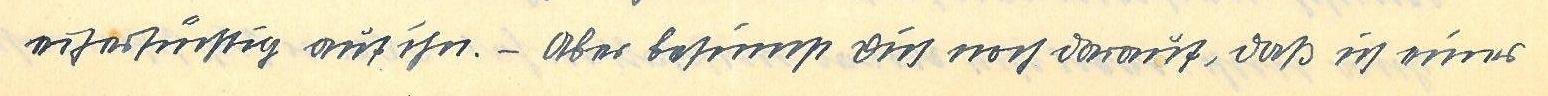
eifersüchtig auf ihn. – Aber besinnst Dich noch darauf, daß ich eines
